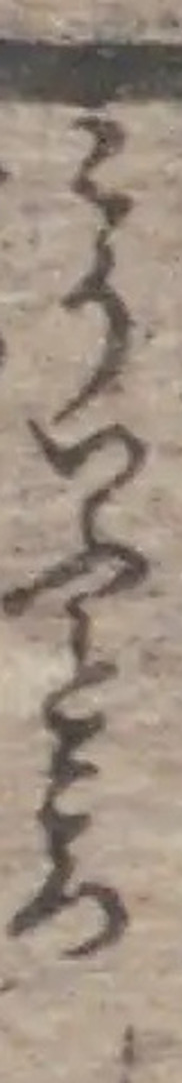こういふところ
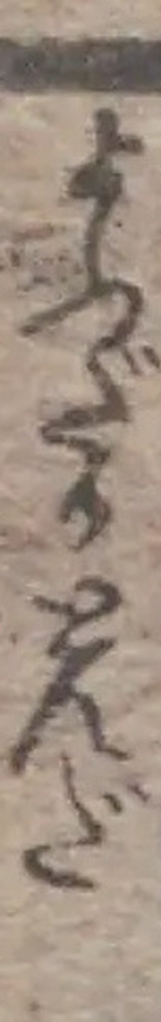よふだかとんだ
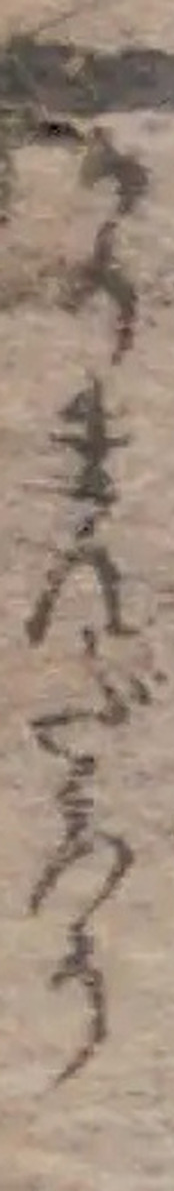かうまんだろう

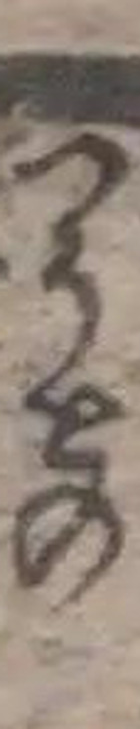つうとの
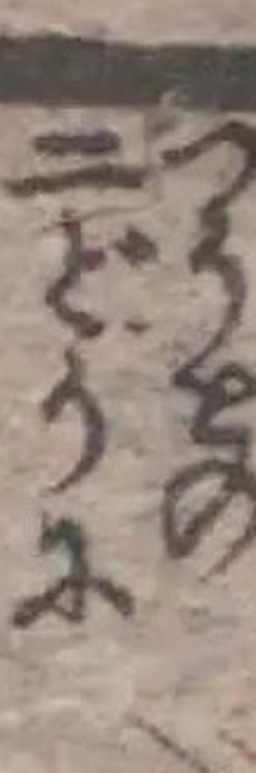ニどうに
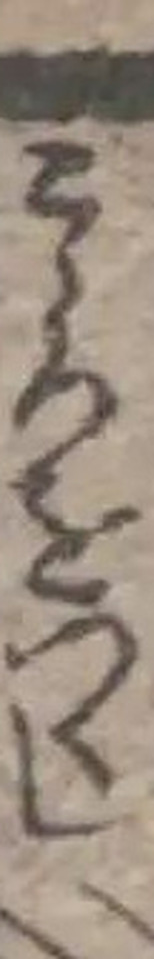こゝろをつくし
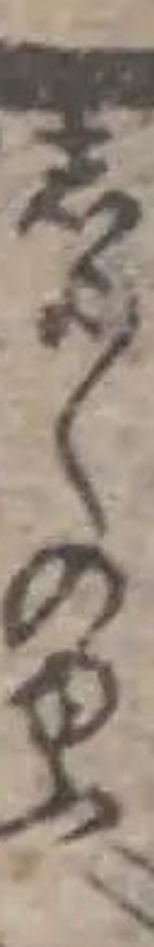しよ〳〵のゆう
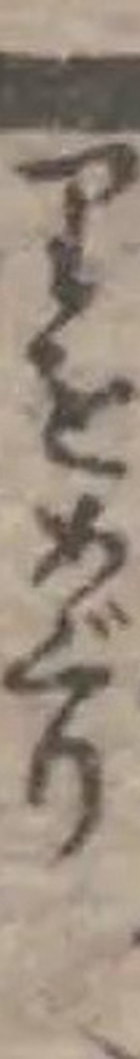りをめぐり
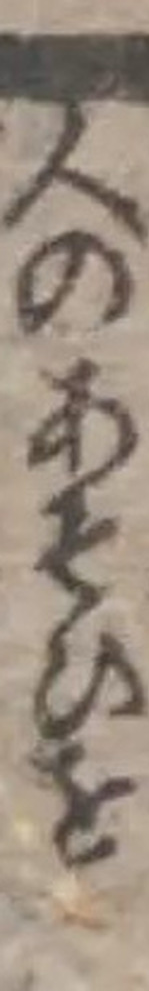人のあそひを
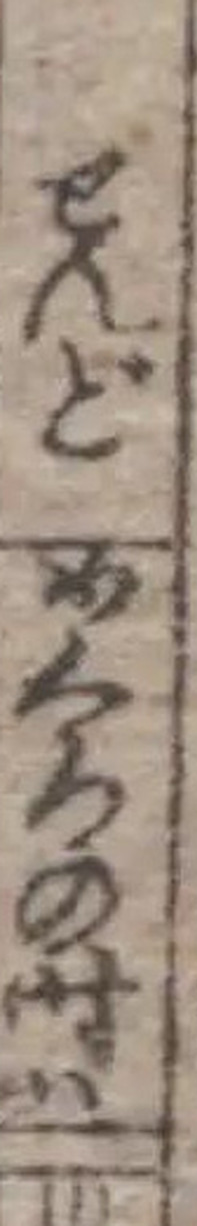せんどめくろの時は
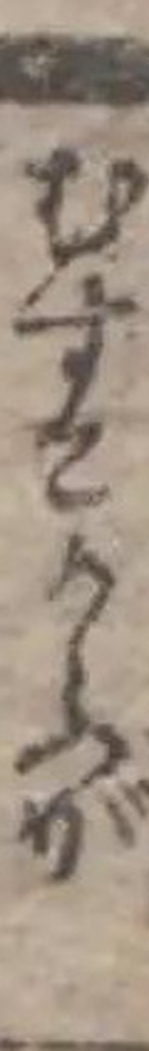むすこかふが
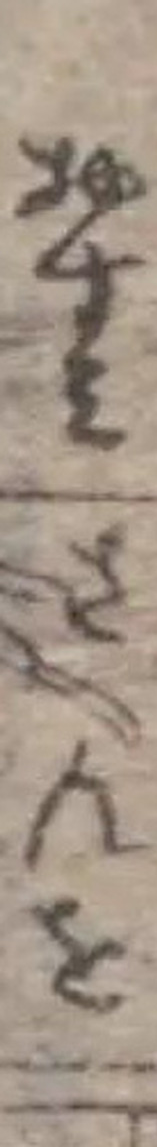おすみさんを
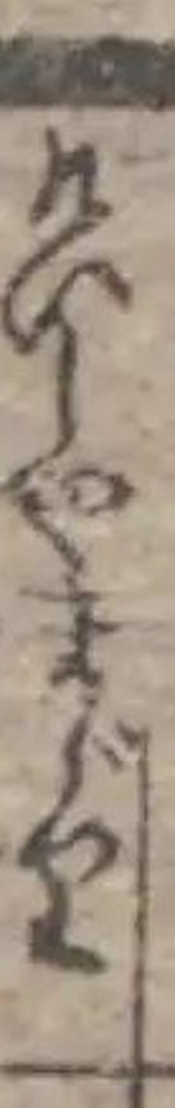けいしやまじり
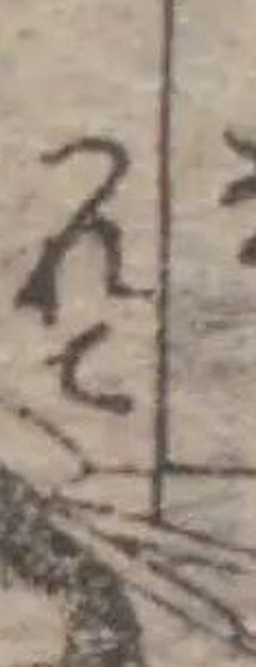つれて
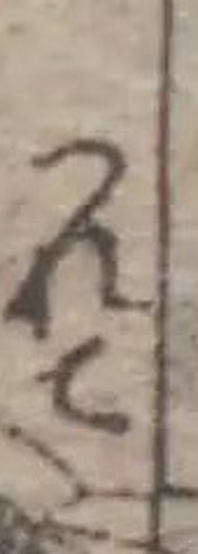つれて
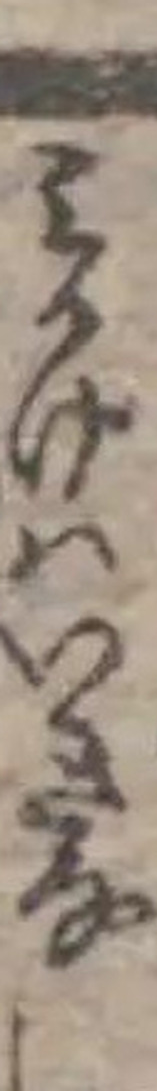みかけはいきな
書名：富多高慢噺 3巻
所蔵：国立国会図書館 National Diet Library, JAPAN
